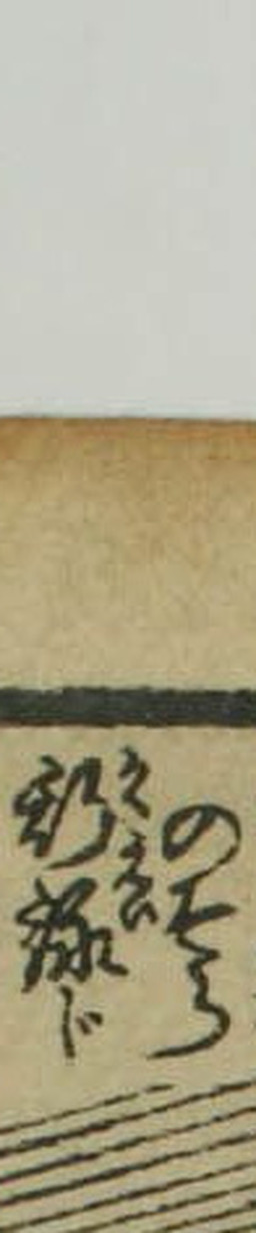斯詠じ
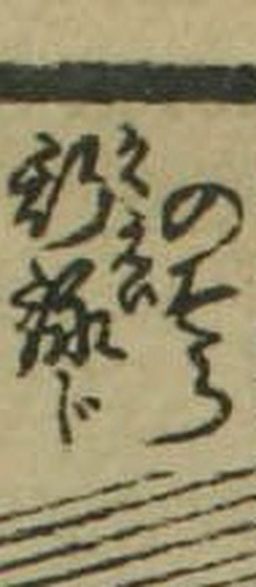斯詠じ
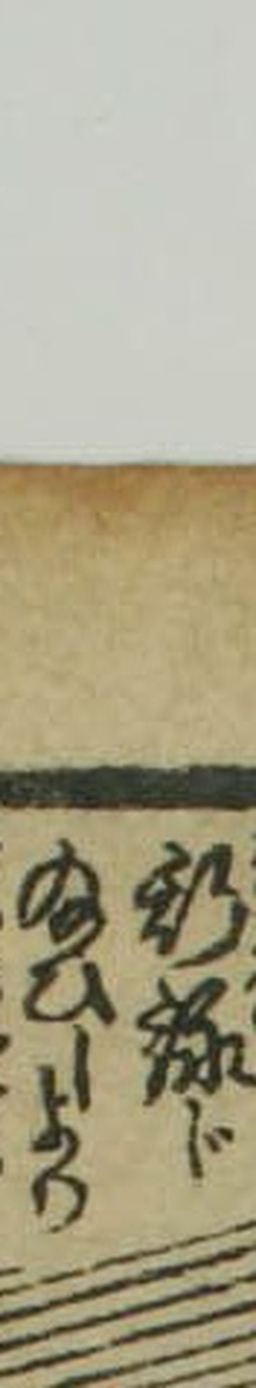給ひしより
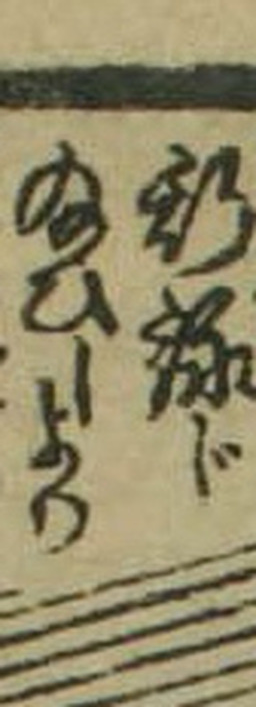給ひしより
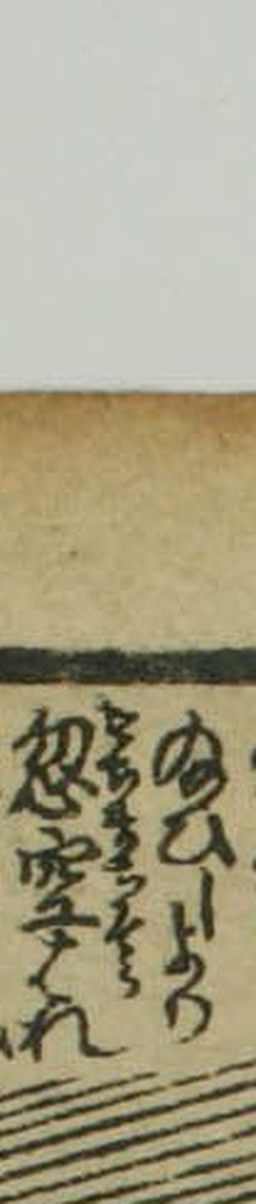忽空はれ
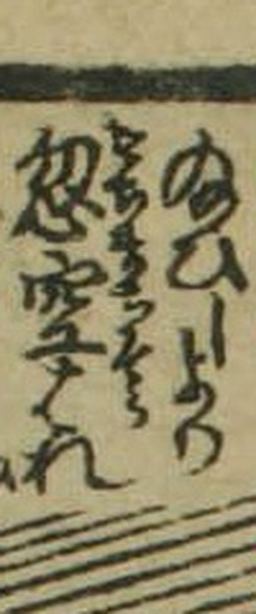忽空はれ
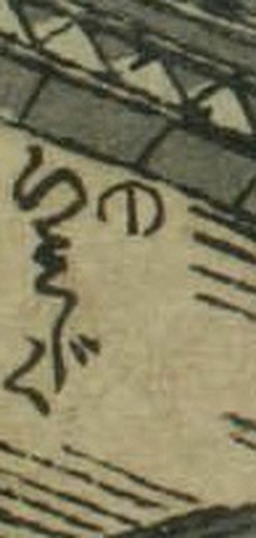いみじく
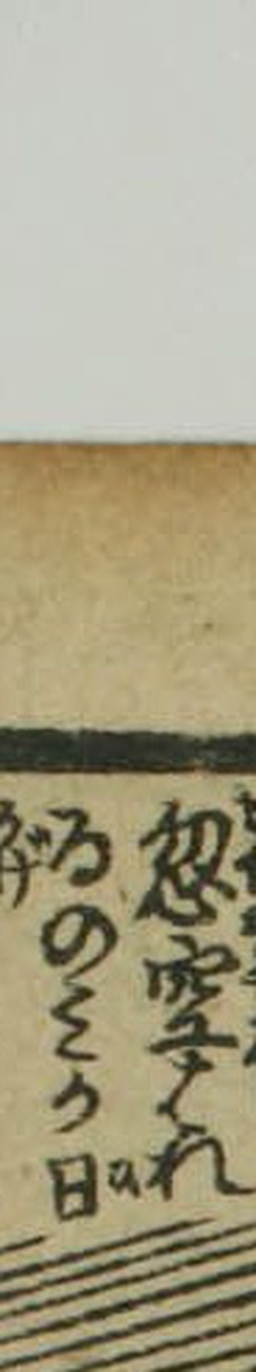るのみか日
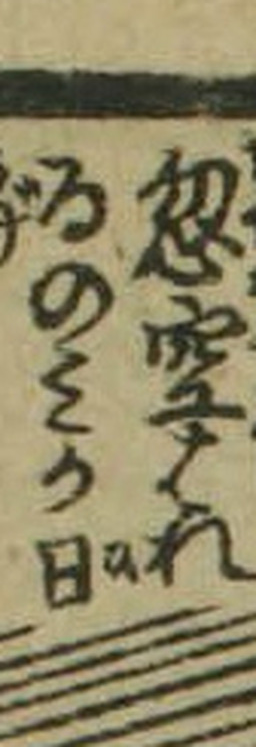るのみか日
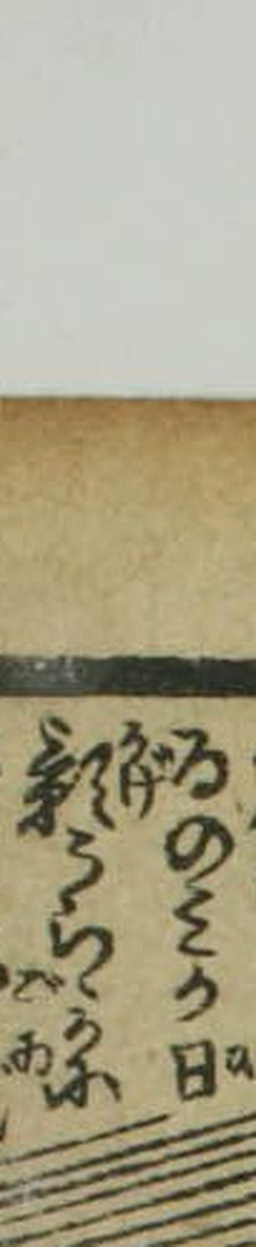影うらゝかに
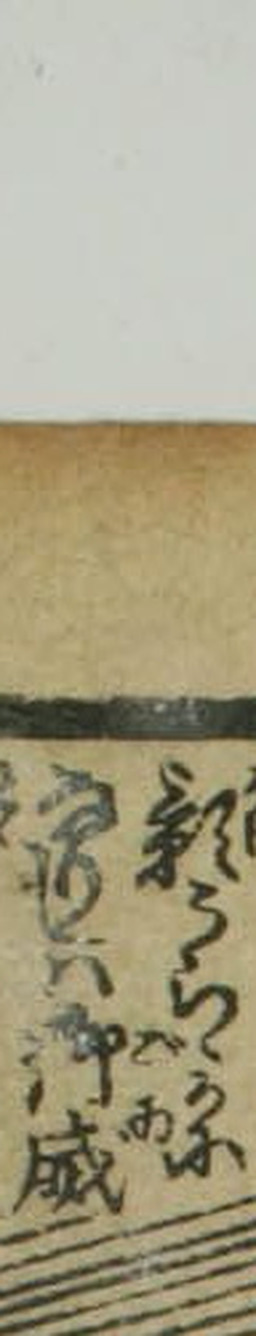なりしは御威
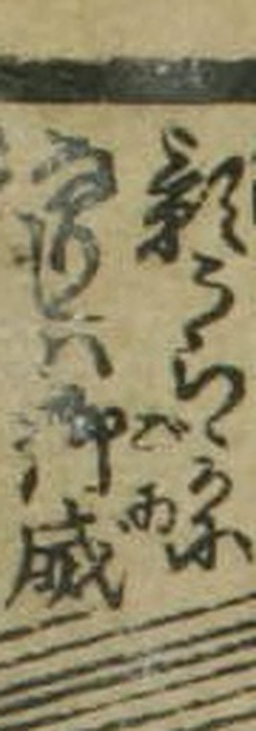なりしは御威
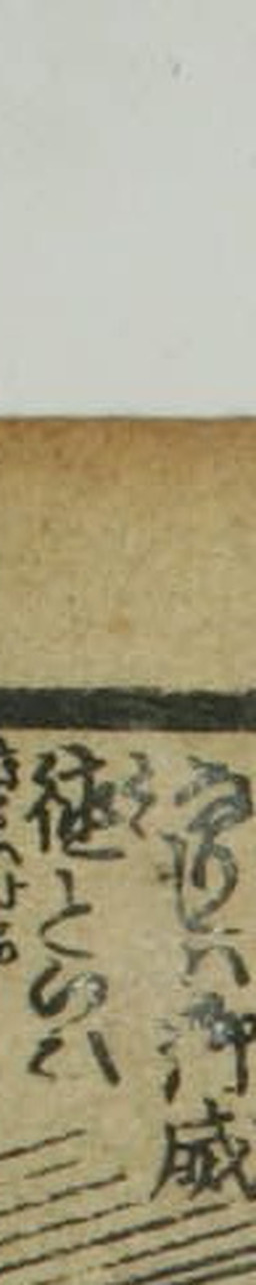徳といひ
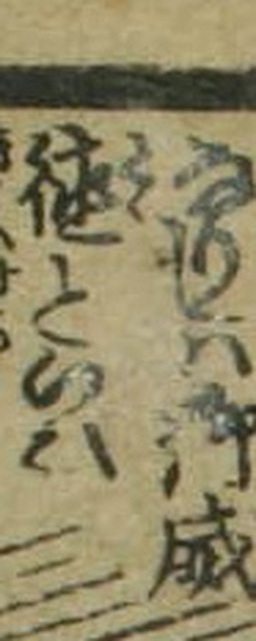徳といひ

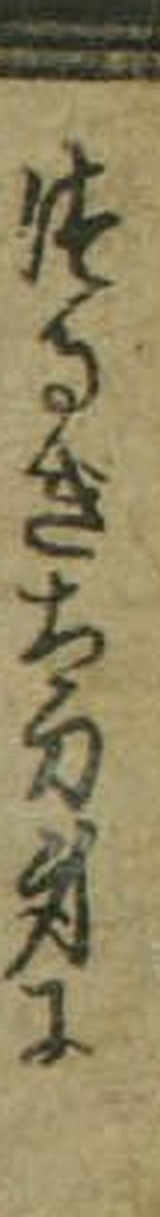つるぎ太刀身に
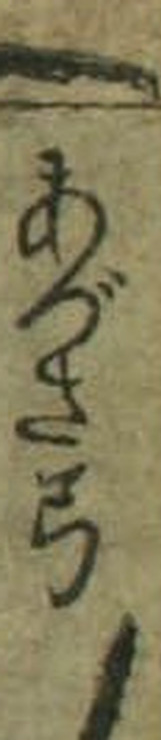あづさ弓
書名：續英雄百人一首
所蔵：東京学芸大学附属図書館
